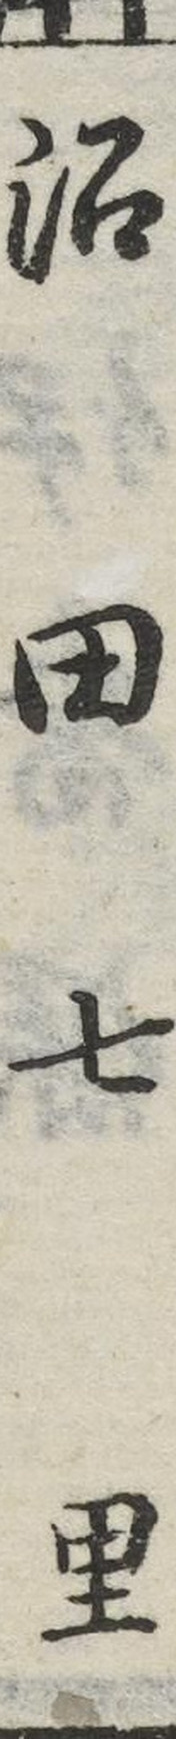沼田七里
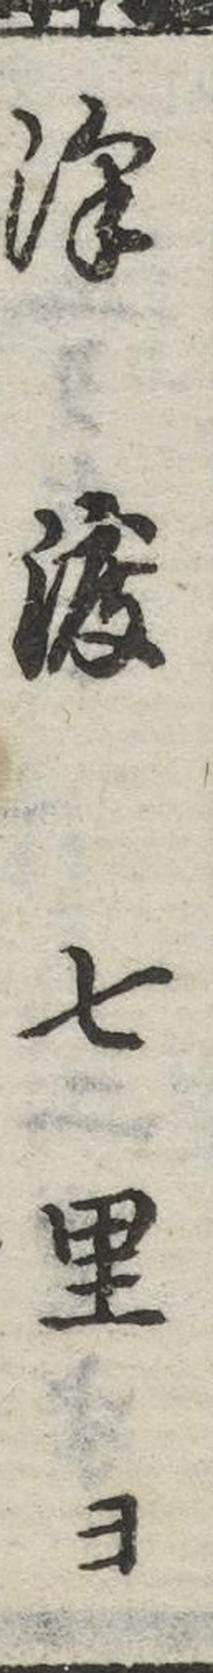澤渡七里ヨ
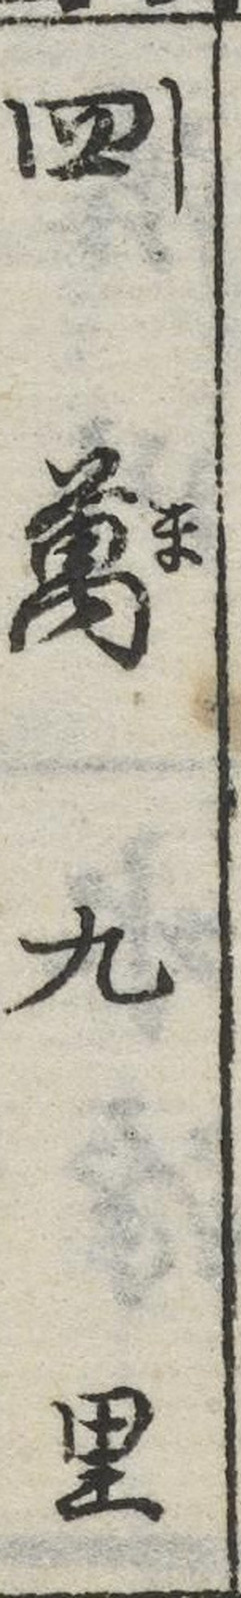四萬九里
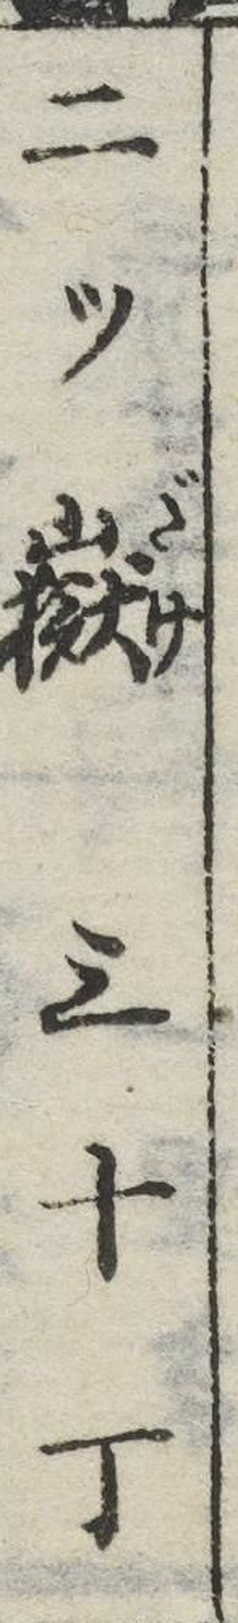二ツ嶽三十丁
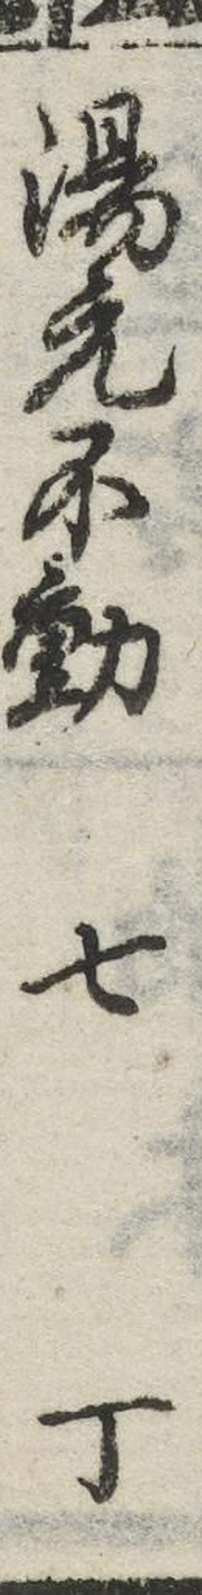湯元不動七丁
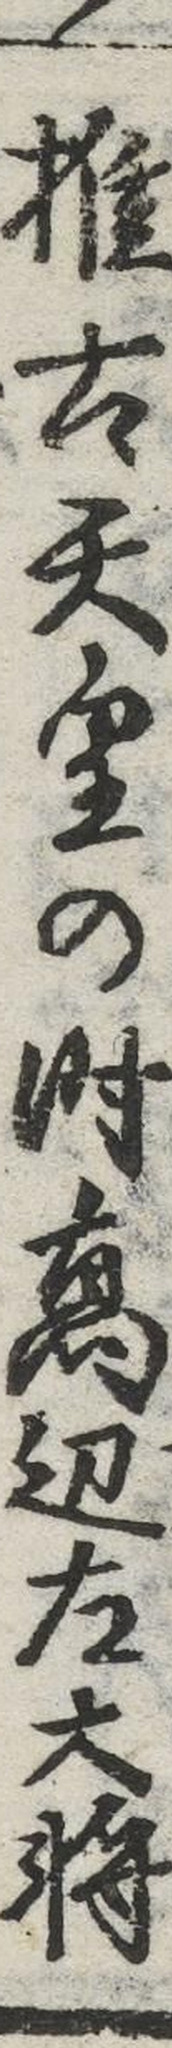推古天皇の時高辺左大将
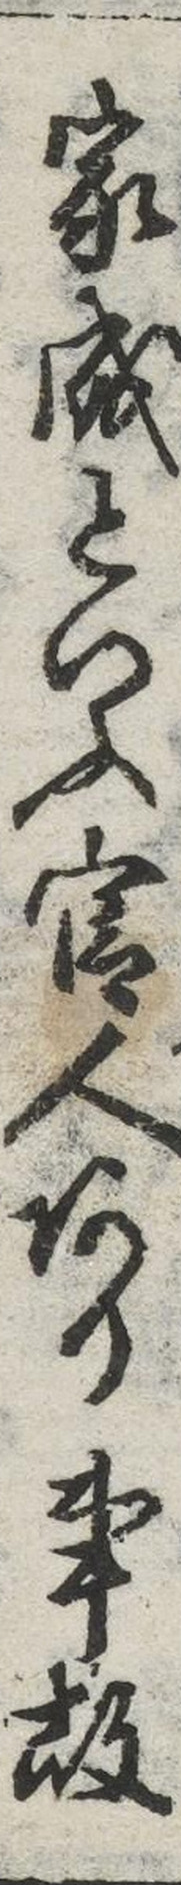家茂といふ官人あり事故
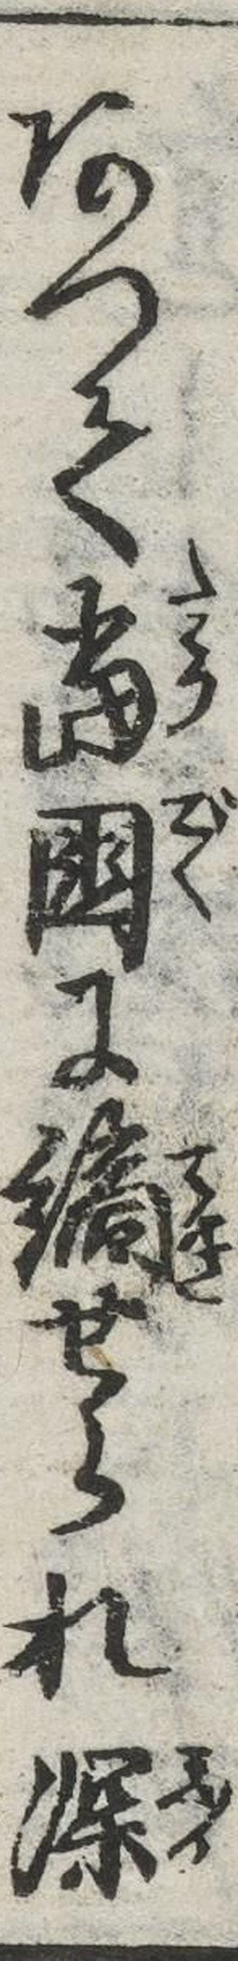あつて當國に謫せられ深
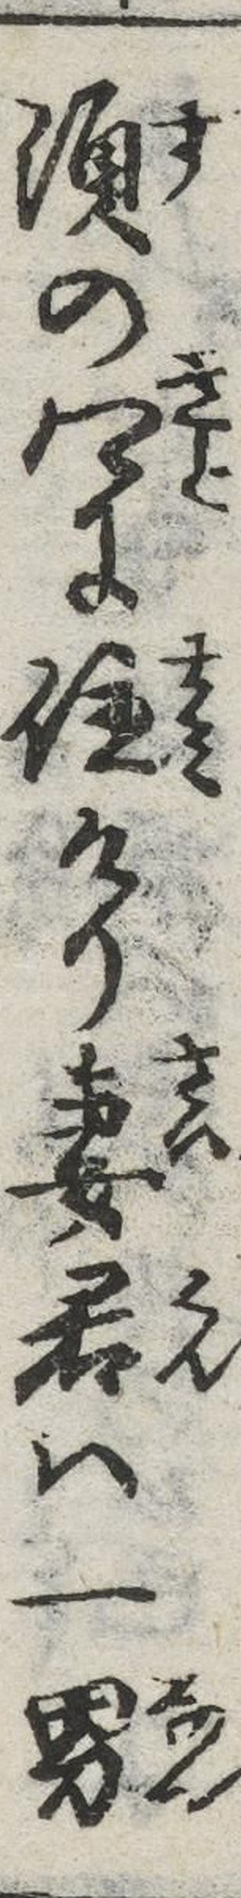須の郷に住たり妻君ハ一男
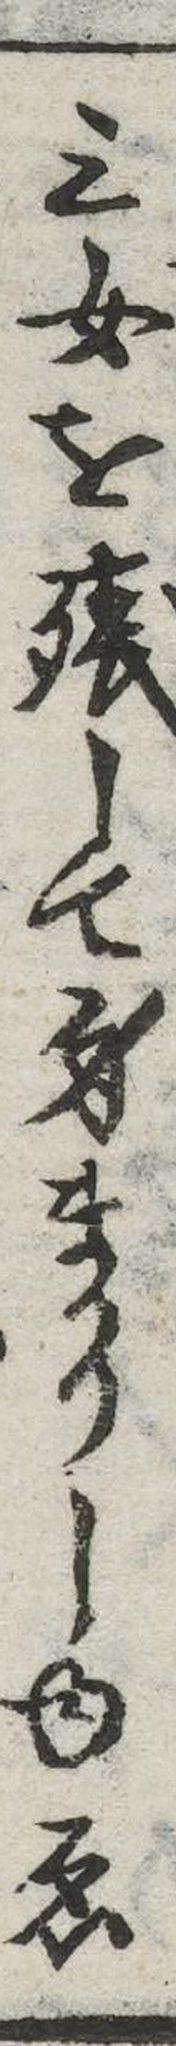三女を残して身まかりしゆゑ
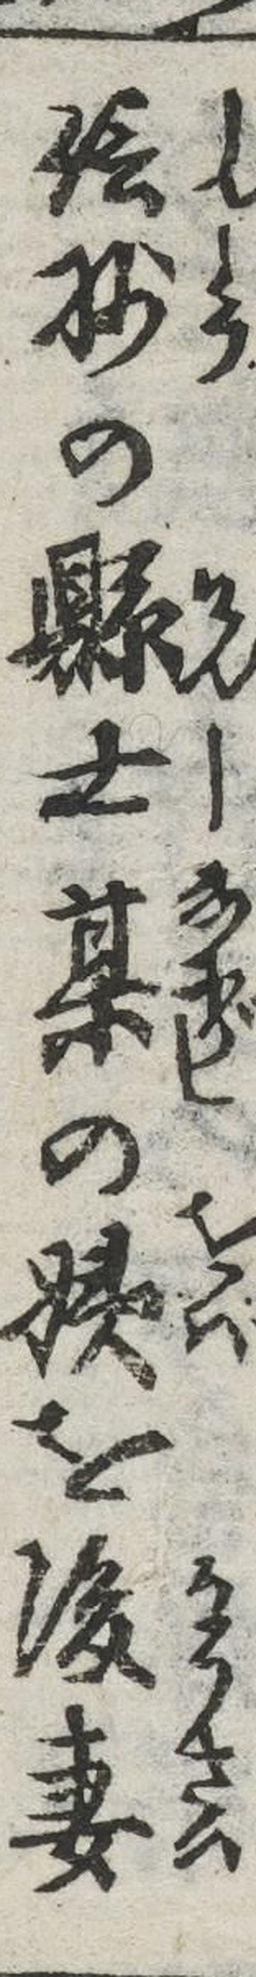信州の縣士某の姨を後妻
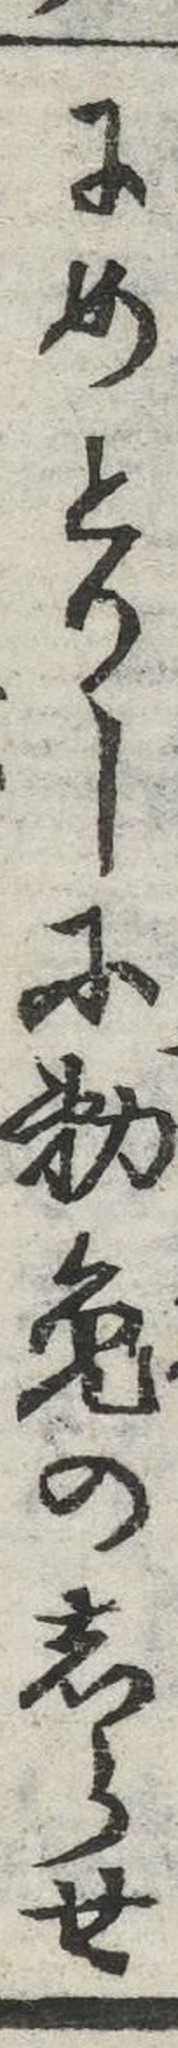にめとりしに勅免のしらせ
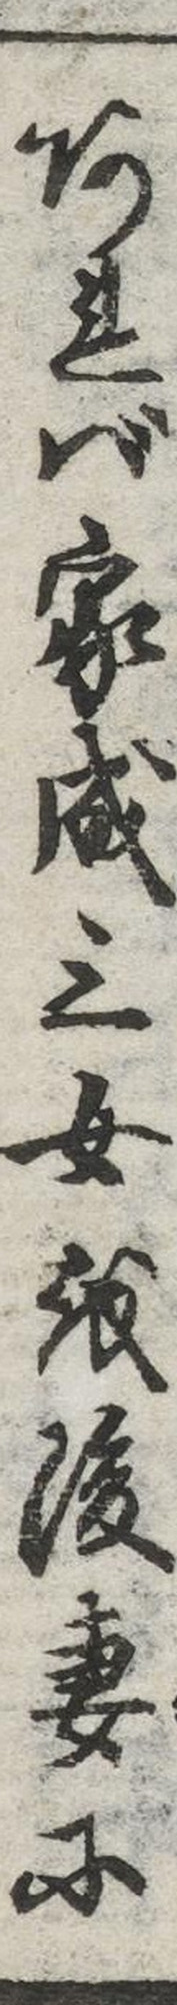あれば家茂三女を後妻に
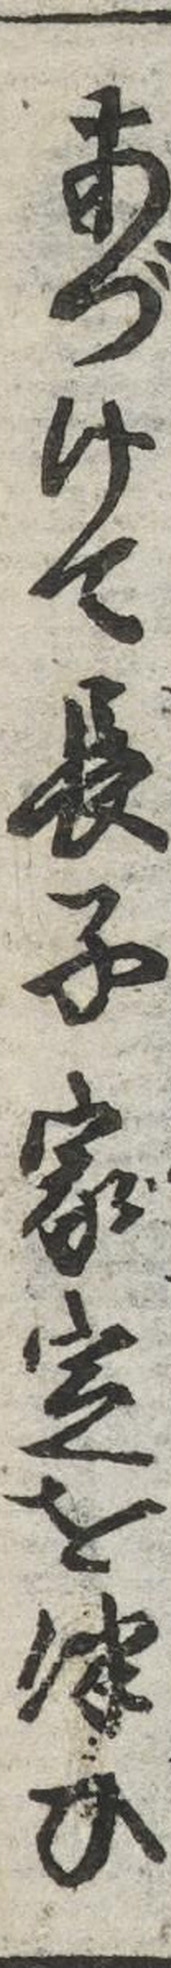あづけて長子家定を伴ひ

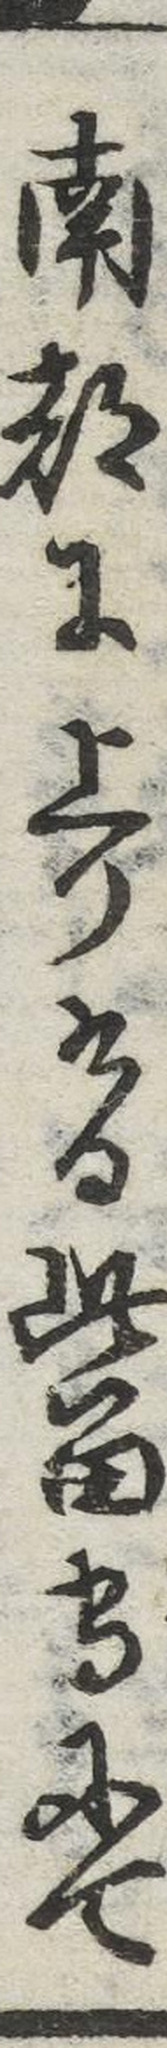南都に上りたる此留守にて
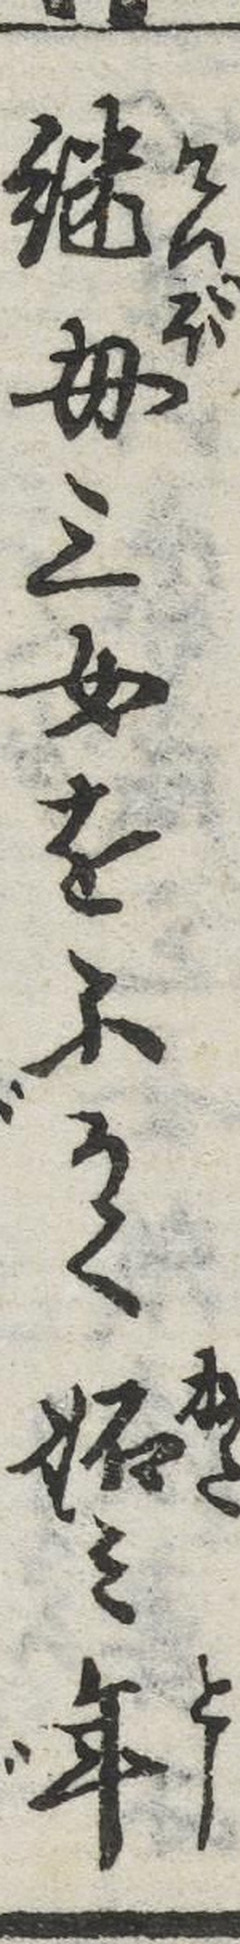継母三女をふかく妬み年
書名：諸國温泉遊覽記　全
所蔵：東京大学地震研究所図書室 Earthquake Research Institute Library, The University of Tokyo, JAPAN
